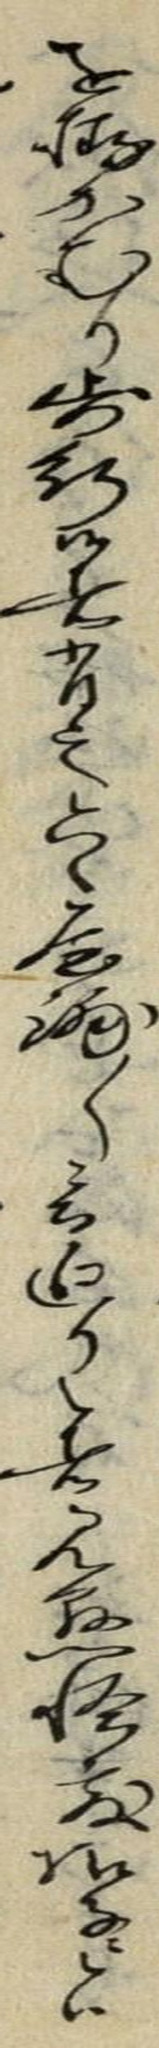を拵かむり歩行候者有之候はゝ屋鋪〳〵にて廻り之者見懸怪敷様子に候は
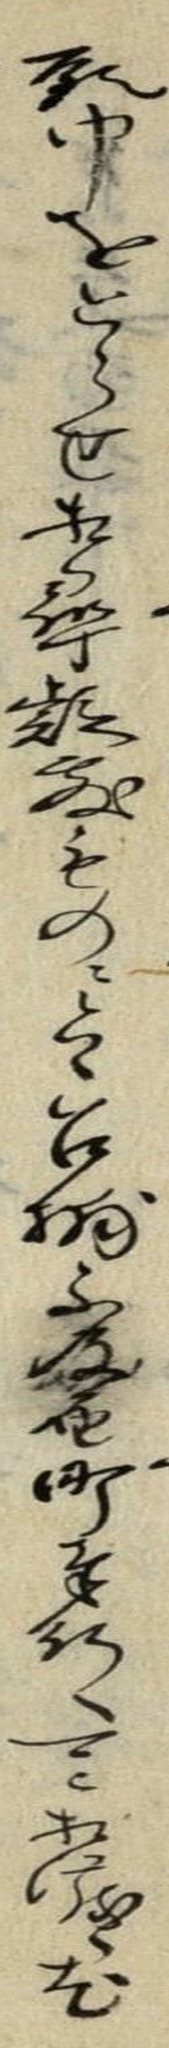頭巾をとらせ相尋疑敷ものに候はゝ召捕不及届町奉行へ可被相渡候尤
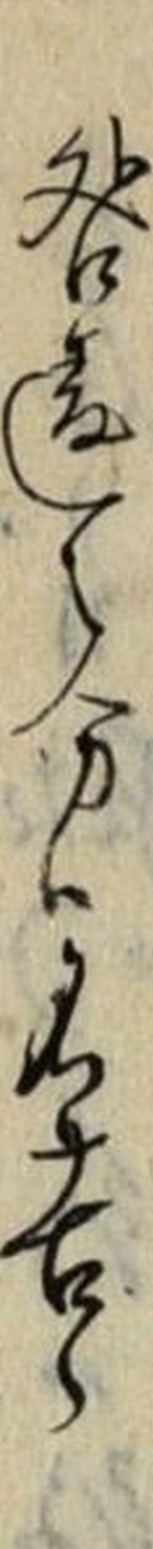咎違之分は不苦候
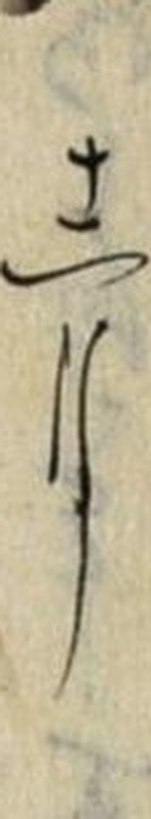十二月
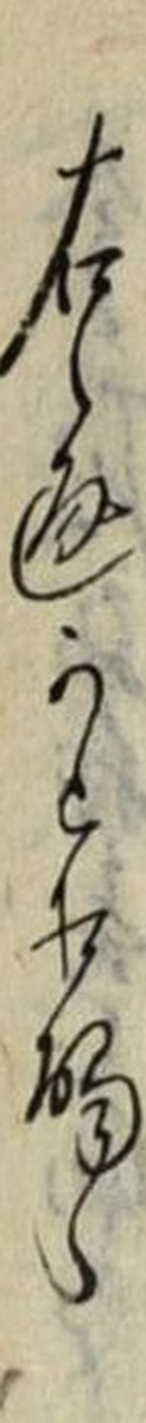右之通可被相触候
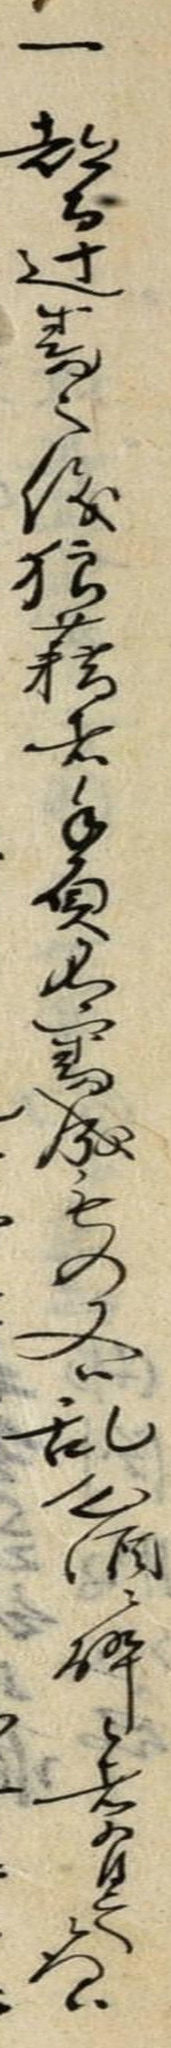一都て辻番之儀狼藉者手負不審成もの又は乱心酒に酔候者有之候得は
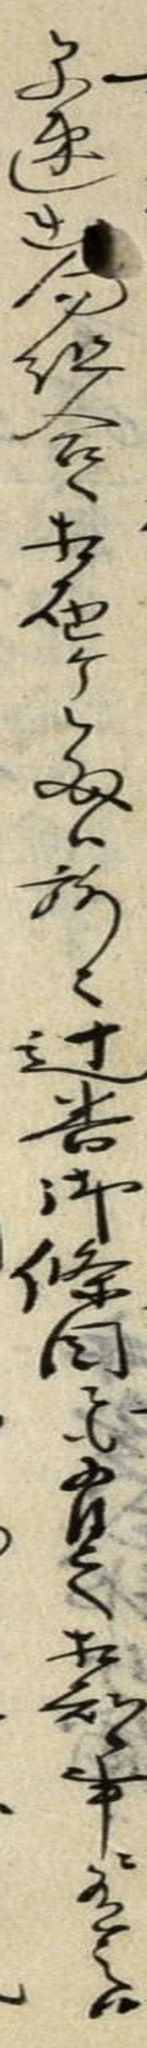早速出向組合へ相届ケ候義は所々辻番御條目にも有之相知候事に有之候
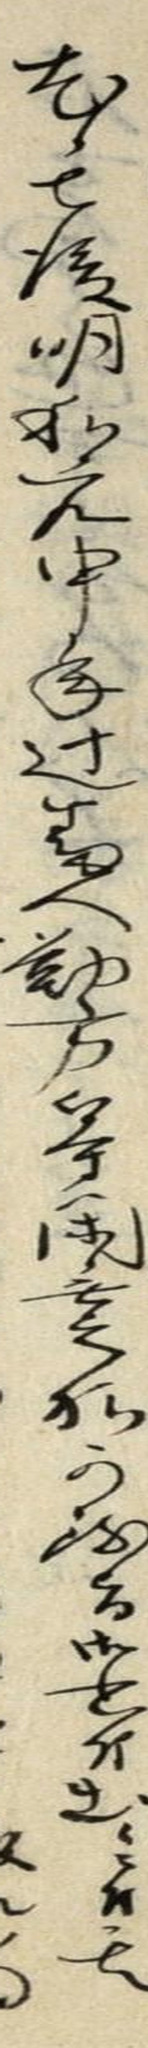尤其後明和元申年辻番人勤方等閑無之様可致旨御書付出候に付其
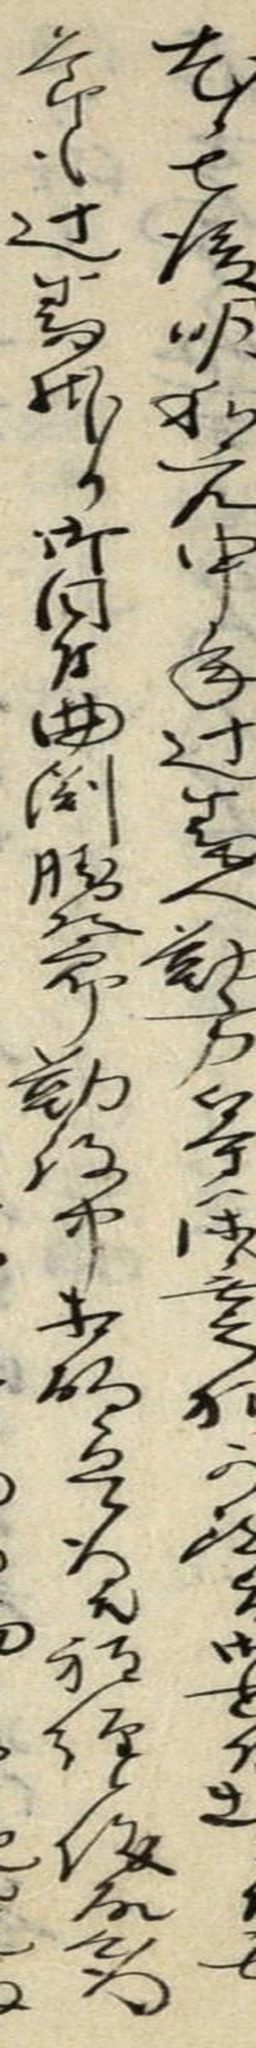節も辻番掛り御目付曲渕勝次郎勤役中相触置候得共程軽候儀故心得
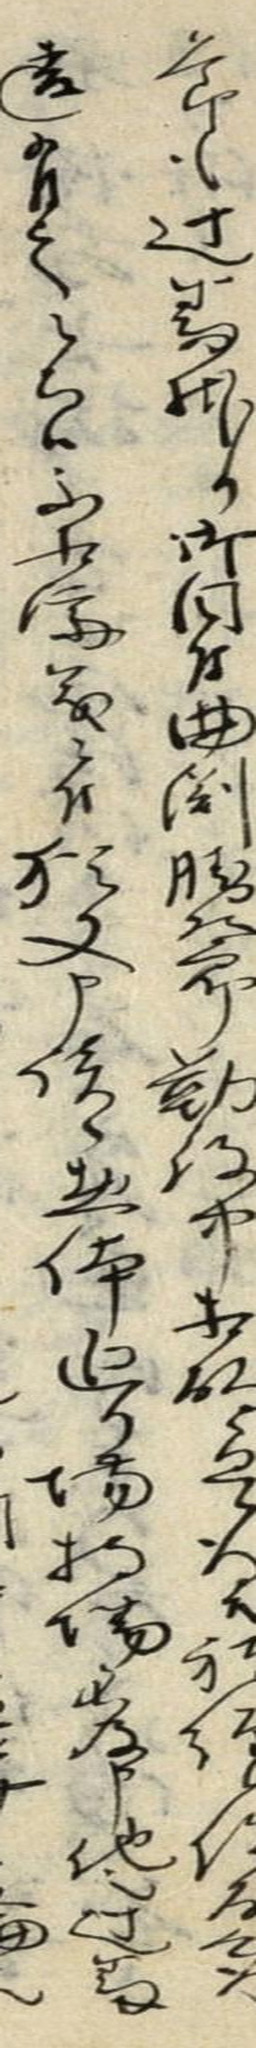違有之候ては不相済義に付猶又申談候惣体廻り場持場不及申他之辻番
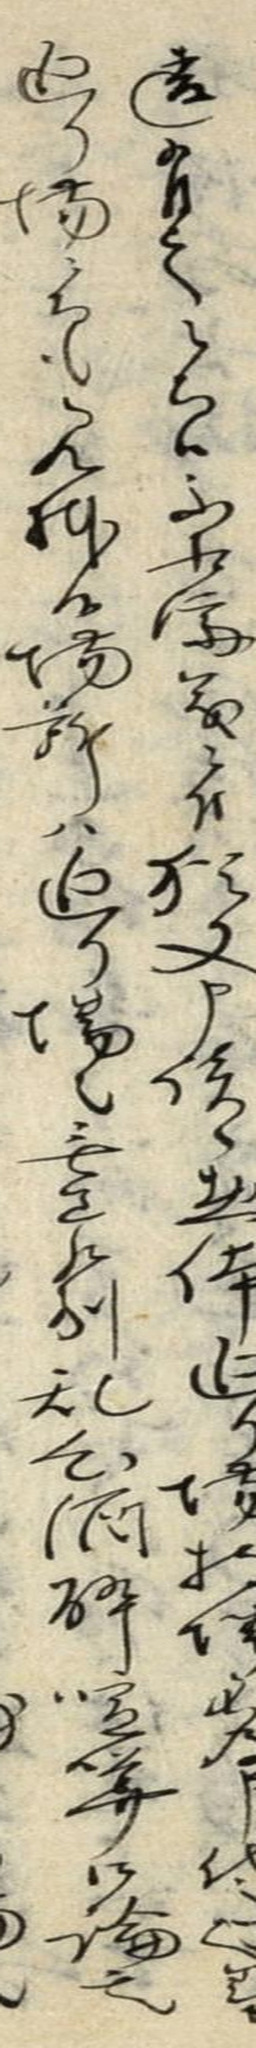廻り場にても見掛候場所は廻り場之無差別乱心酒酔喧嘩口論其
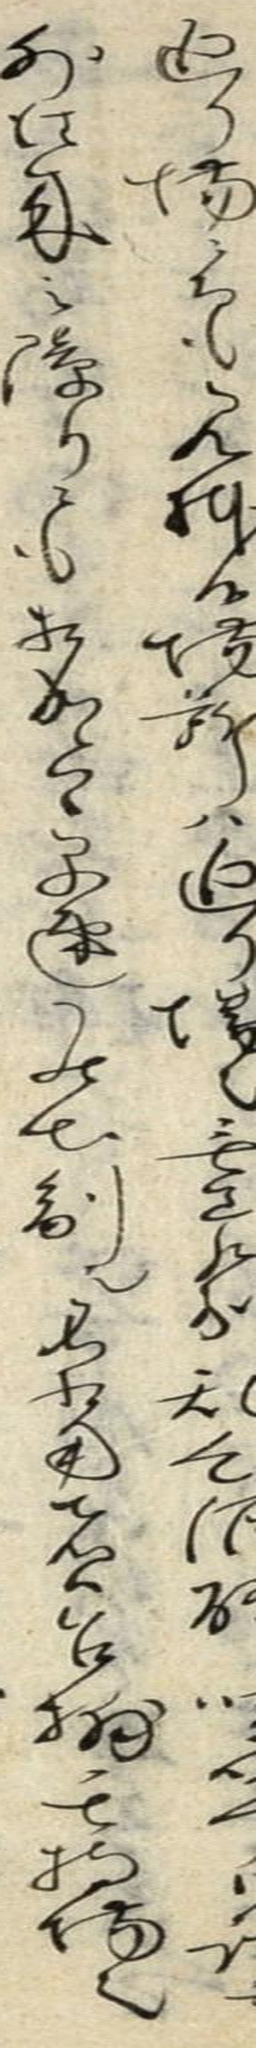外往来之障りにも相成候はゝ早速罷出制し不相用者は召捕其持場之
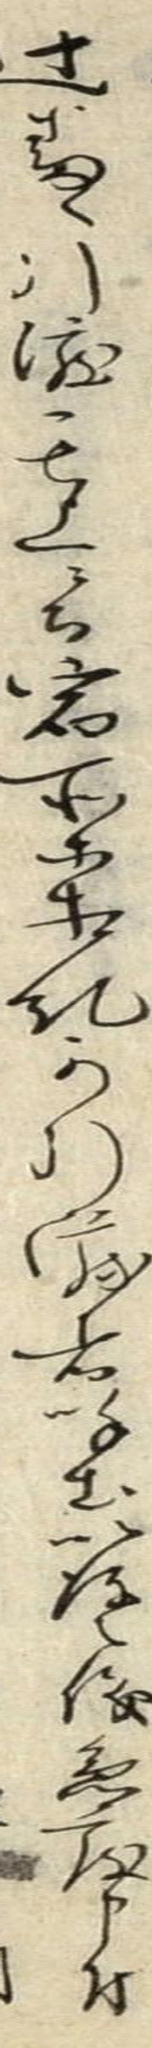辻番へ引渡其上にて宿所等相糺可引渡者呼出以後之儀急度申付
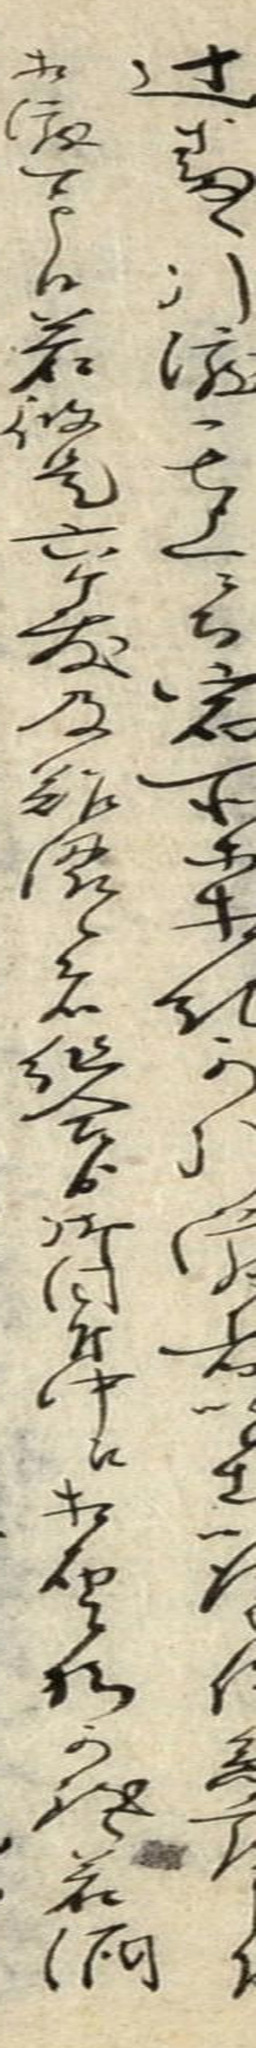相渡可申候若彼是六ケ敷及難渋候者組合ゟ御目付中江相届候様可致候若酒
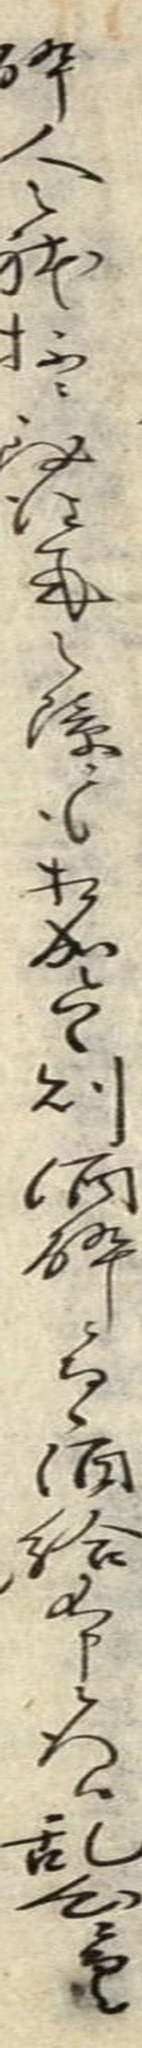酔人之体抔に致往来之障にも相成候はゝ則酒酔にて候酒給不申候得は乱心にて候
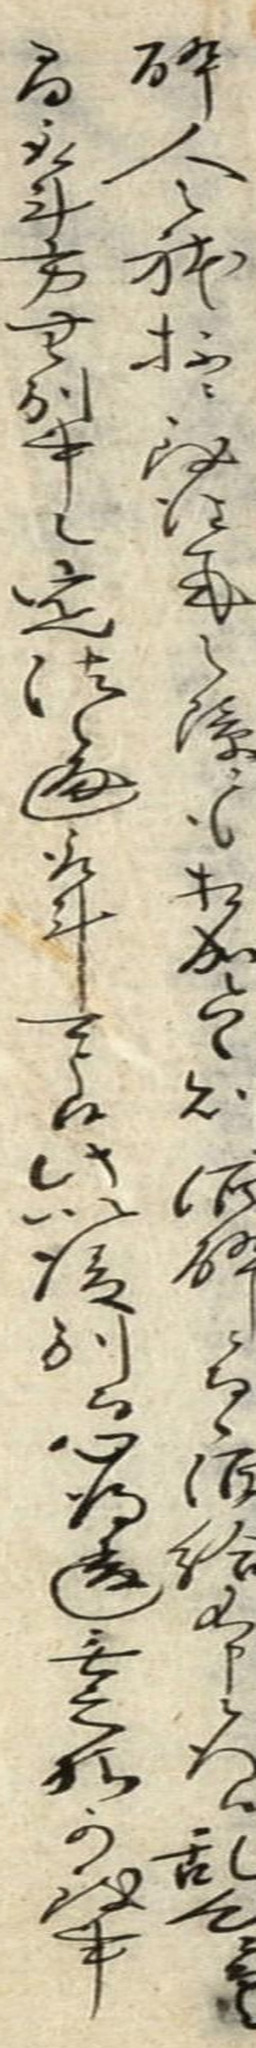間取計方無別事候定法之通取計可申候此以後別て心得違無之様可致事
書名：三都并道中之部
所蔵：福井県文書館 Fukui Prefectural Archives
